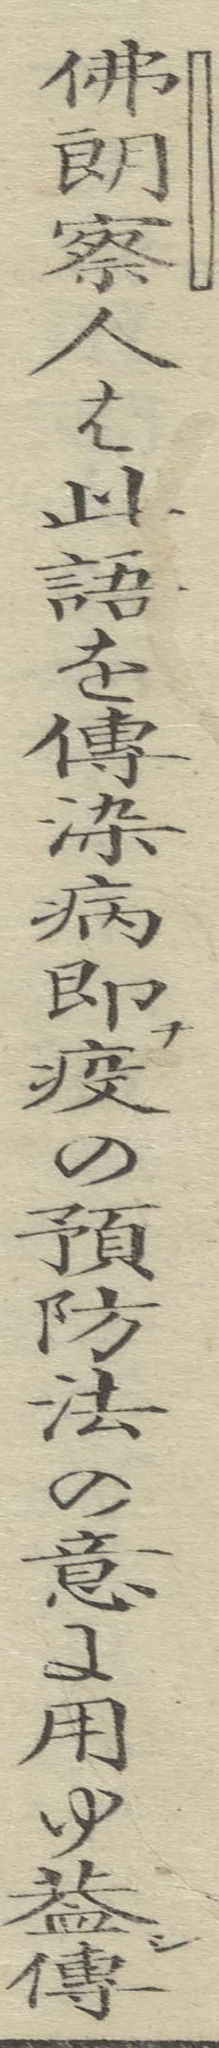佛朗察人は此語を傅染病即疫の預防法の意に用ゆ葢傅
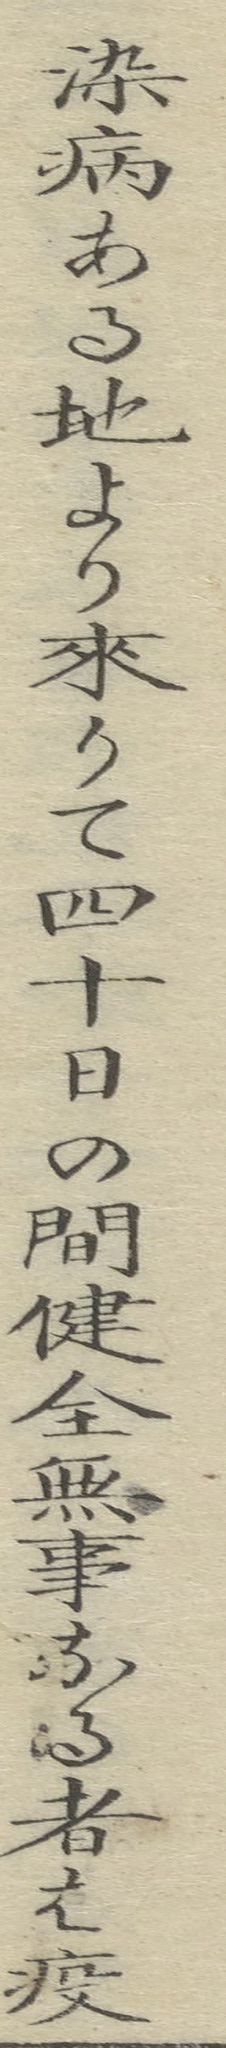染病ある地より來りて四十日の間健全無事なる者は疫
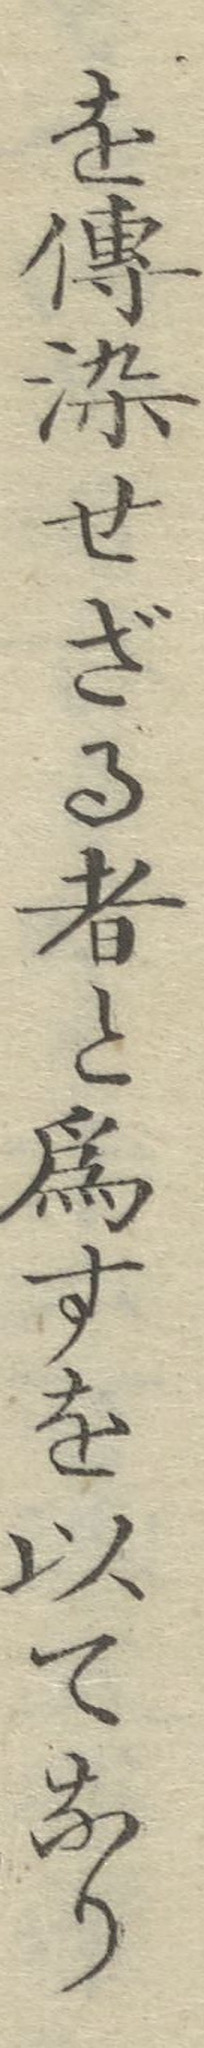を傅染せざる者と為すを以てなり
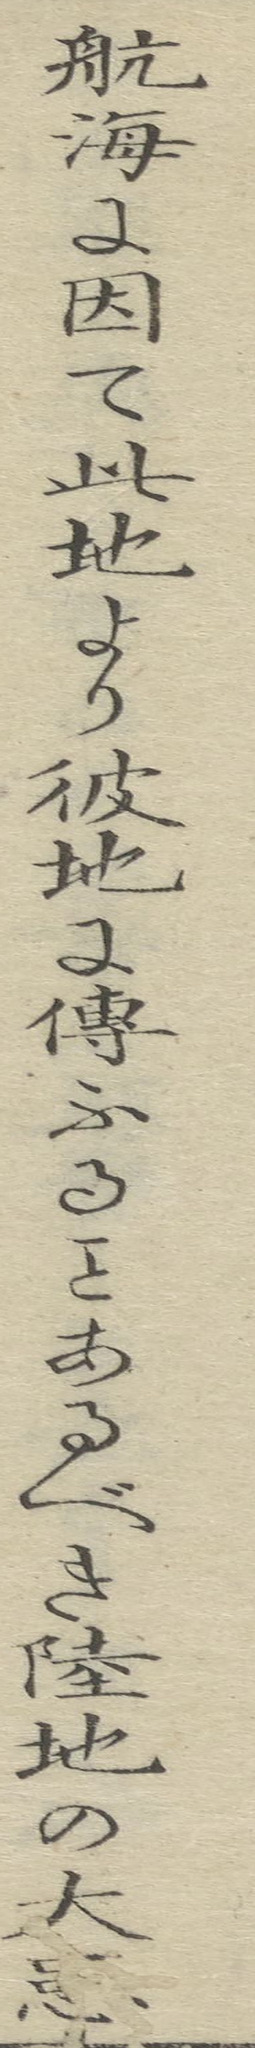航海に因て此地より彼地に傅ふることあるべき陸地の大患
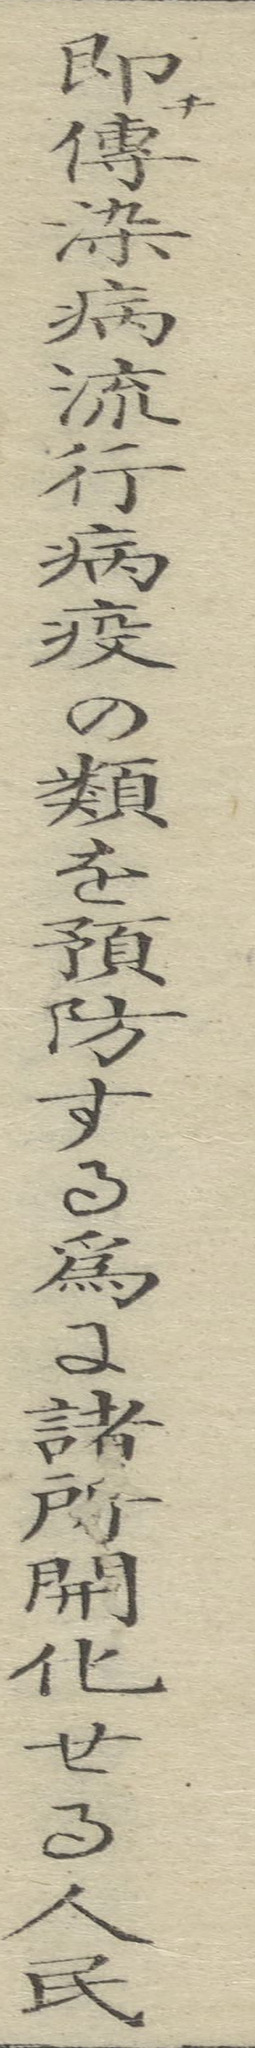即傅染病流行病疫病の類を預防する為に諸所開化せる人民
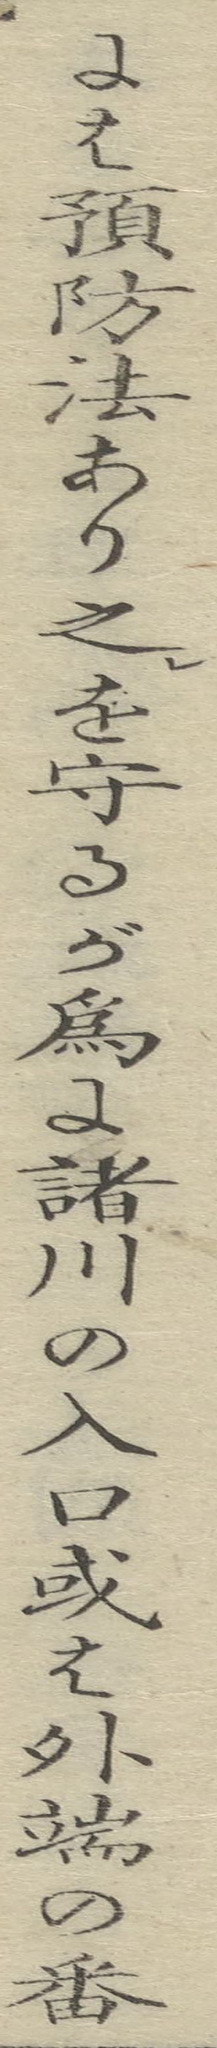には預防法あり之守るが為にに諸川の入口或は外端の番
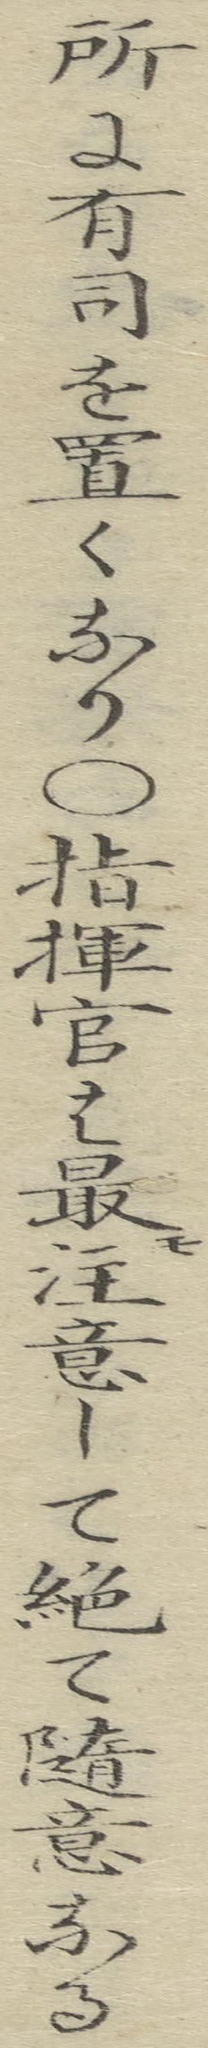所に有司を置くなり〇指揮官は最注意して絶て随意なる
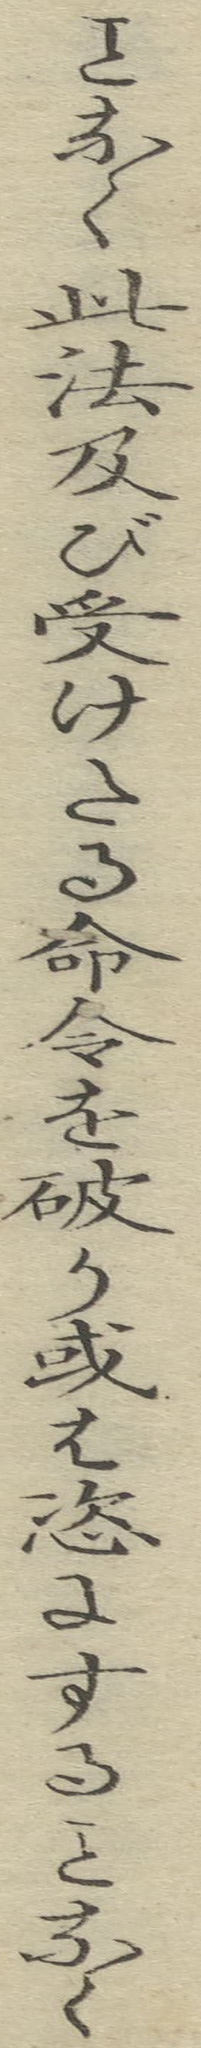ことなく此法及び受けたる命令を破り或は恣にすることなく

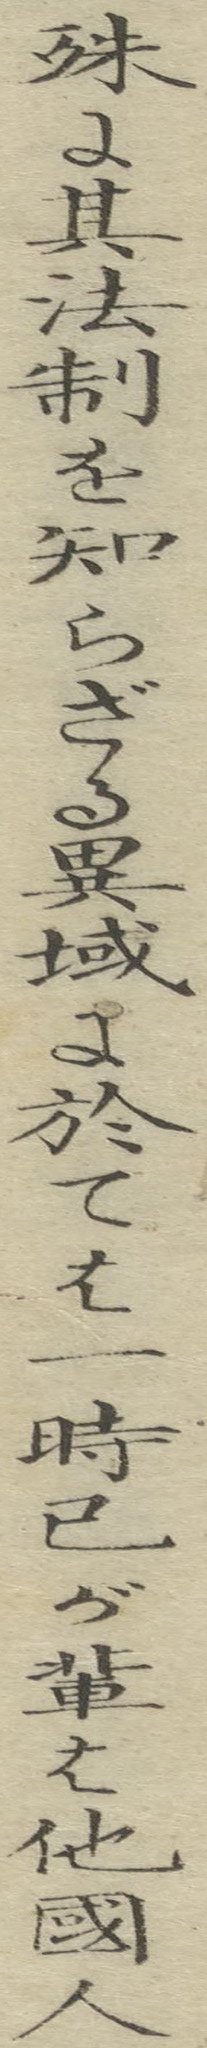殊に其法制を知らざる異域に於ては一時己が輩は他國人
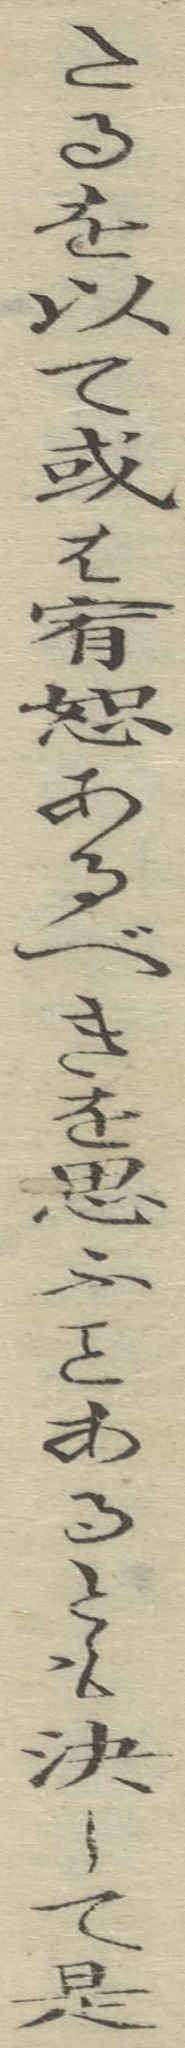たるを以て或は宥恕あるべきを思ふことあるとも決して是
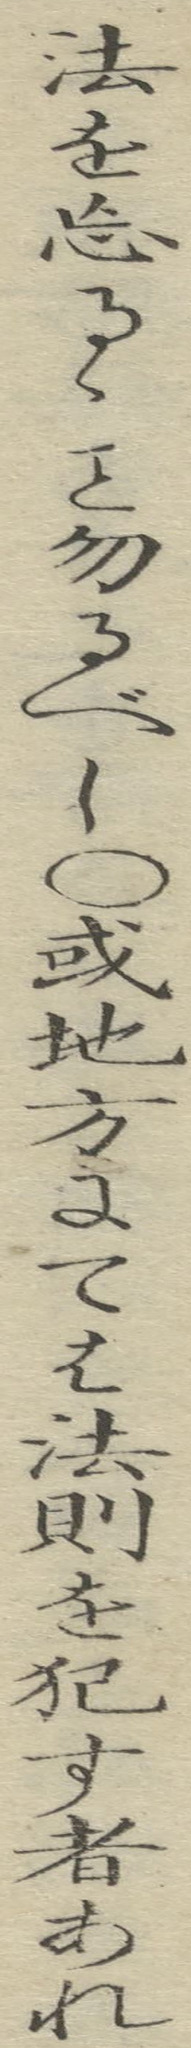法を忘るゝこと勿るべし〇或地方にては法則を犯す者あれ
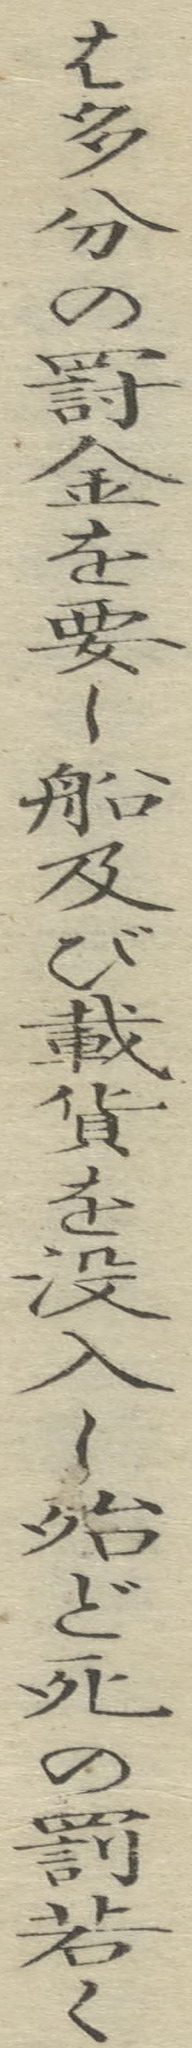は多分の罸金を要し船及び載貨を没入し殆ど死の罰若く
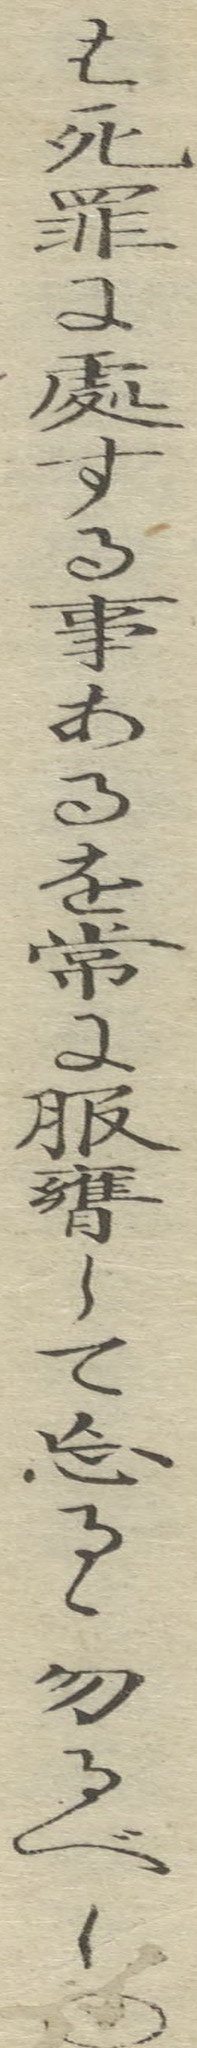は死罪に處する事あるを常に服膺して忘るゝ勿るべし〇
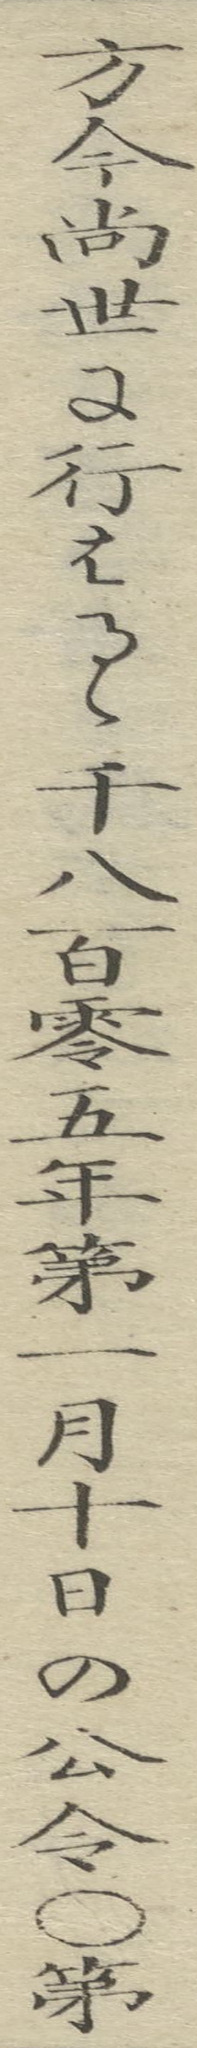方今尚世に行はるゝ千八百零五年第一月十日の公令〇第
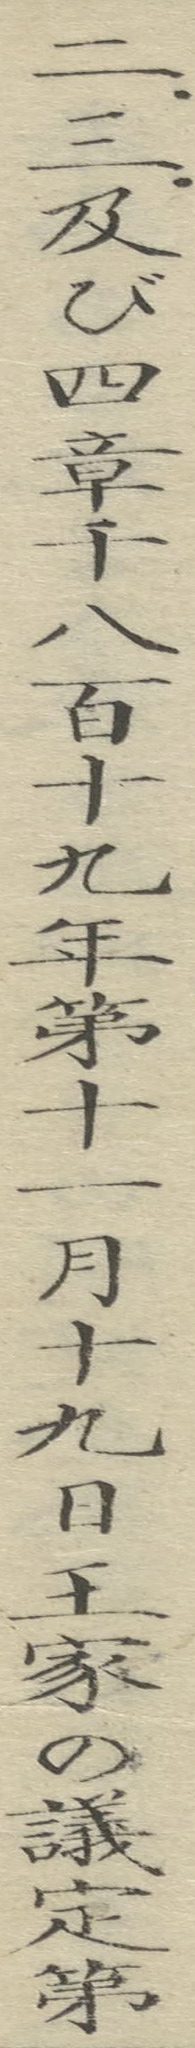二、三、及び四章千八百十九年第十一月十九日王家の議定第
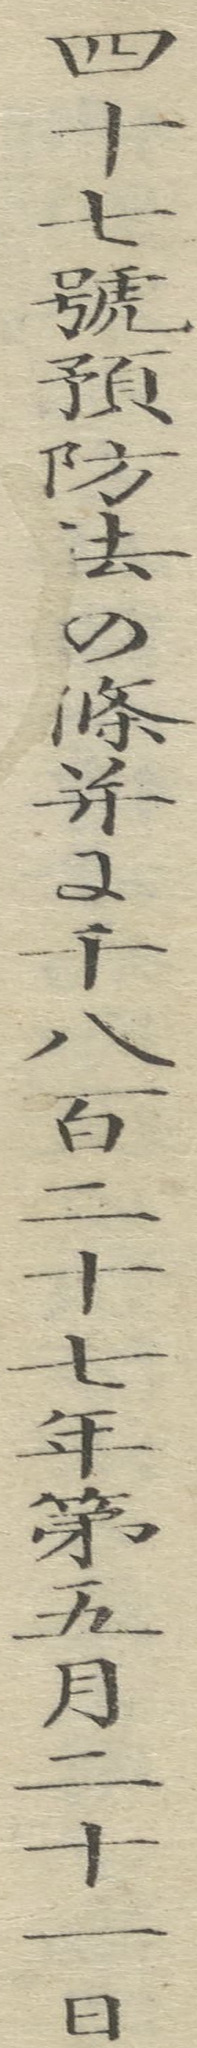四十七號預防法の條并に千八百二十七年第五月二十一日
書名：官版疫毒預防説　全
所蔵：東京大学総合図書館 General Library in the University of Tokyo, JAPAN
